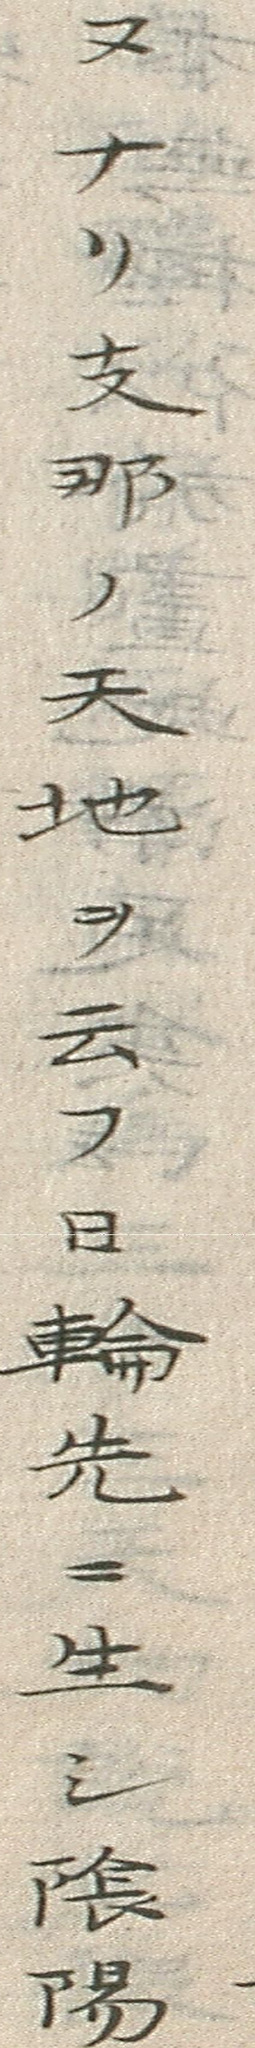メナリ支那ノ天地ヲ云フ日輪先ニ生シ陰陽
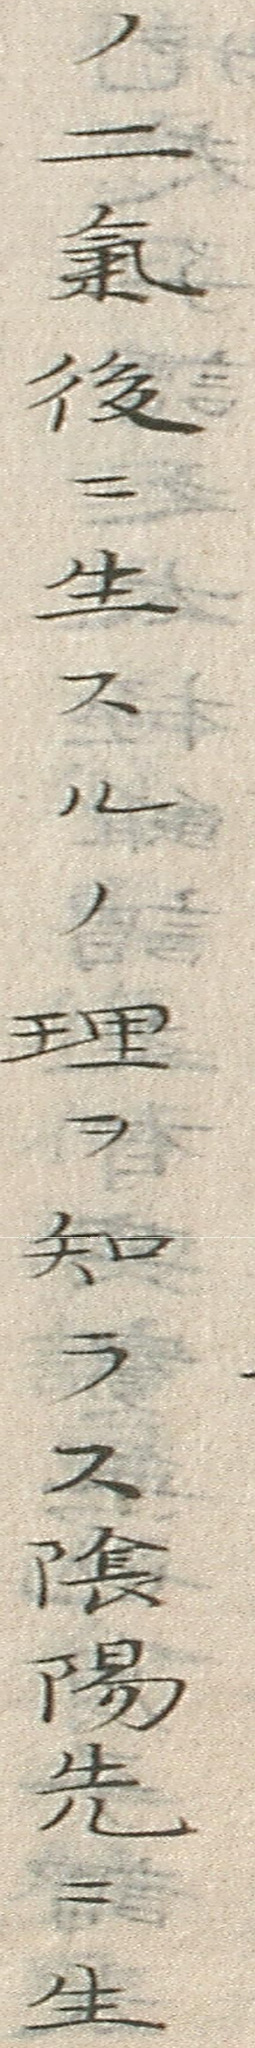ノ二気後ニ生スルノ理ヲ知ラス陰陽先ニ生
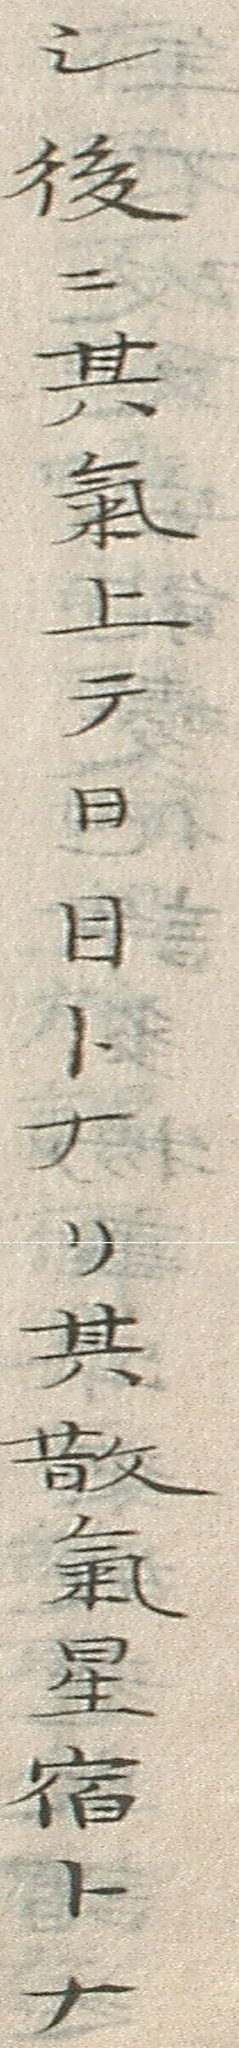シ後ニ其気上テ日月トナリ其散気星宿トナ
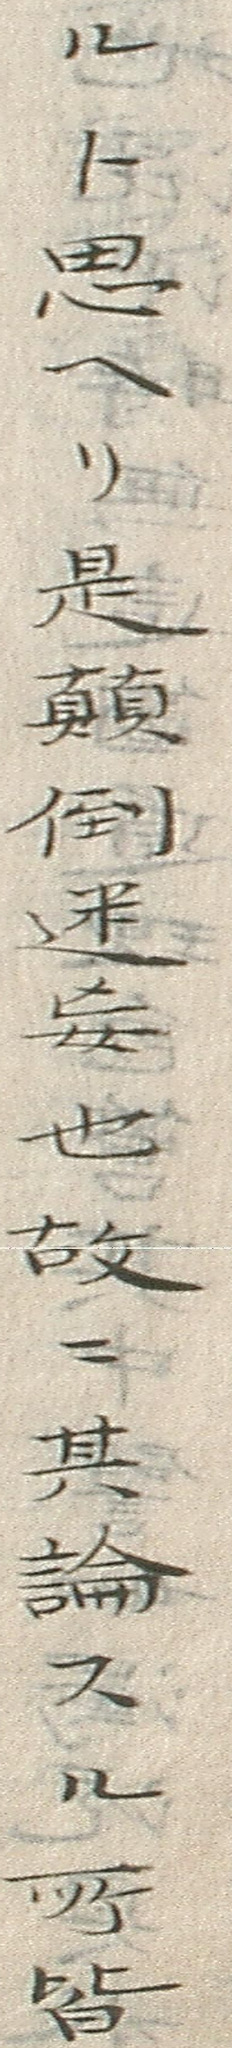ルト思ヘリ是顛倒迷妄也故ニ其論スル所皆
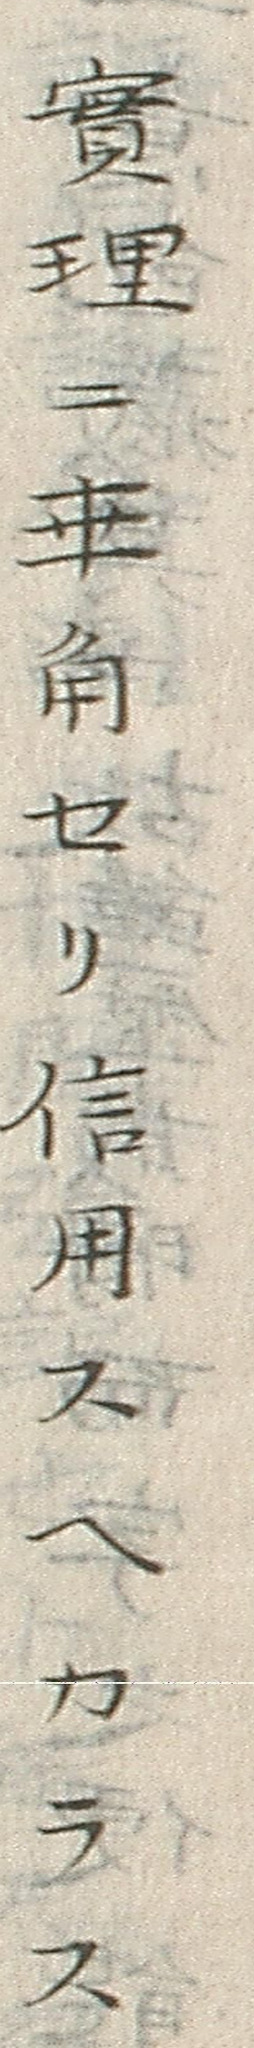実理ニ乖？角セリ信用スヘカラス
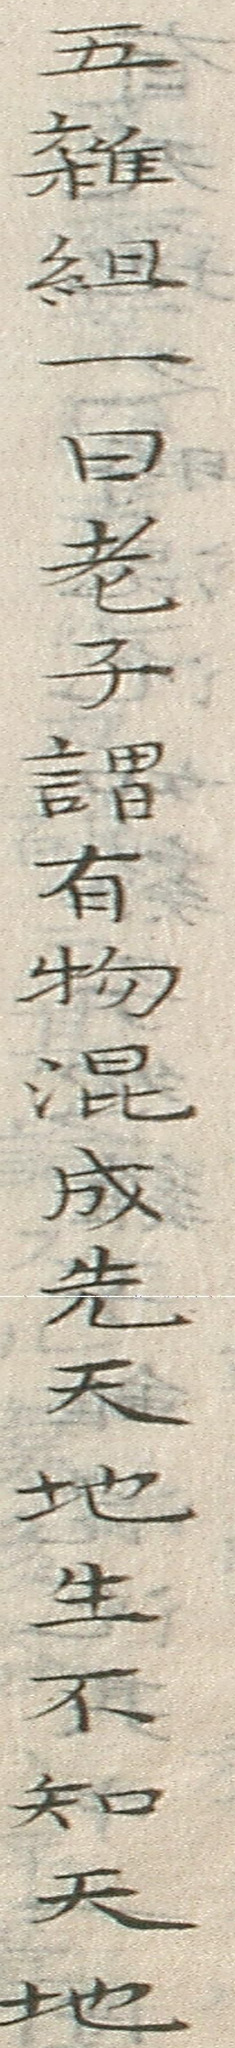五雑組一日老子謂有物混成先天地生不知天地
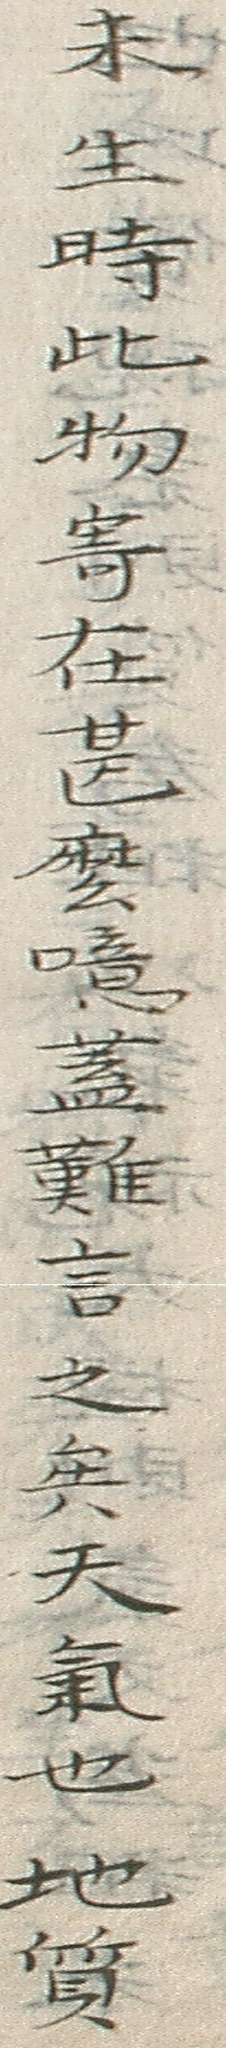未生時此物寄在甚麼噫蓋難言之矣天気也地質

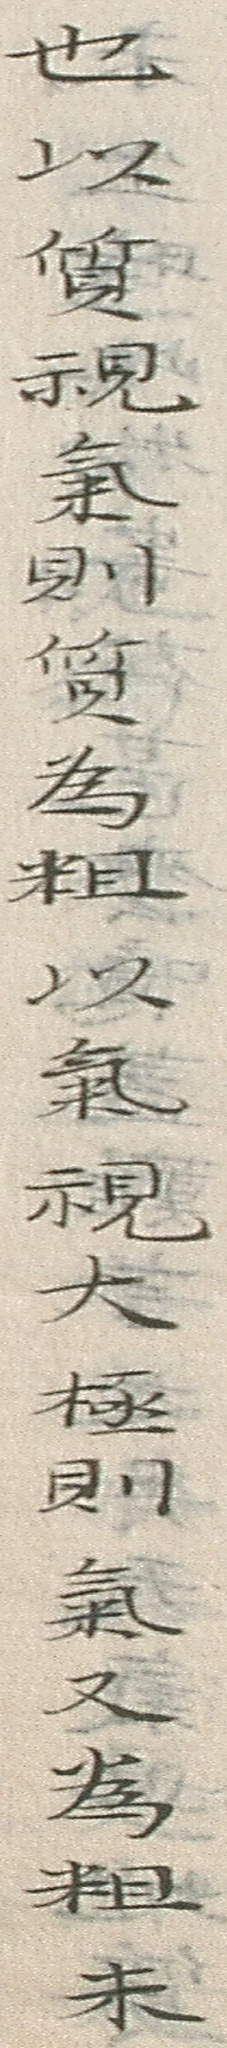也以質視気則質為粗以気視大極則気又為粗未
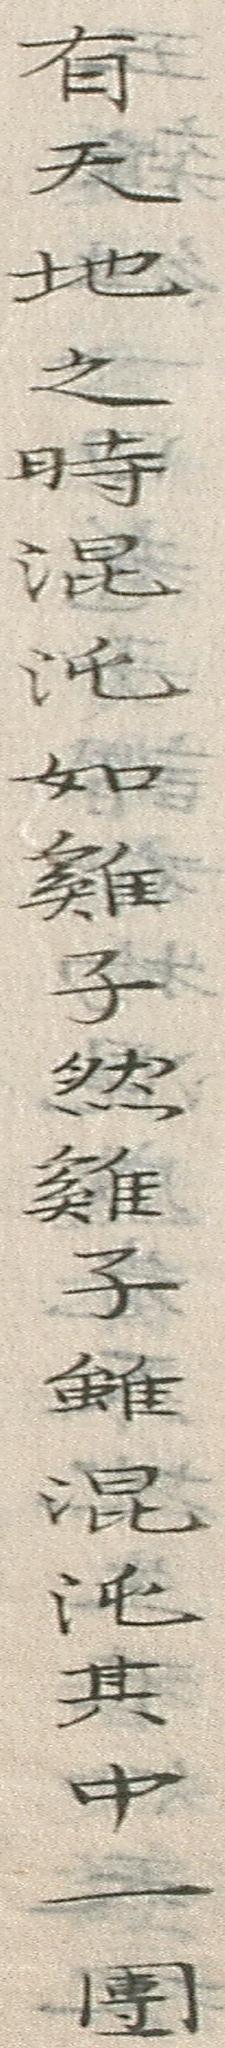有天地之時混沌如雞子然雞子雖混沌其中一団
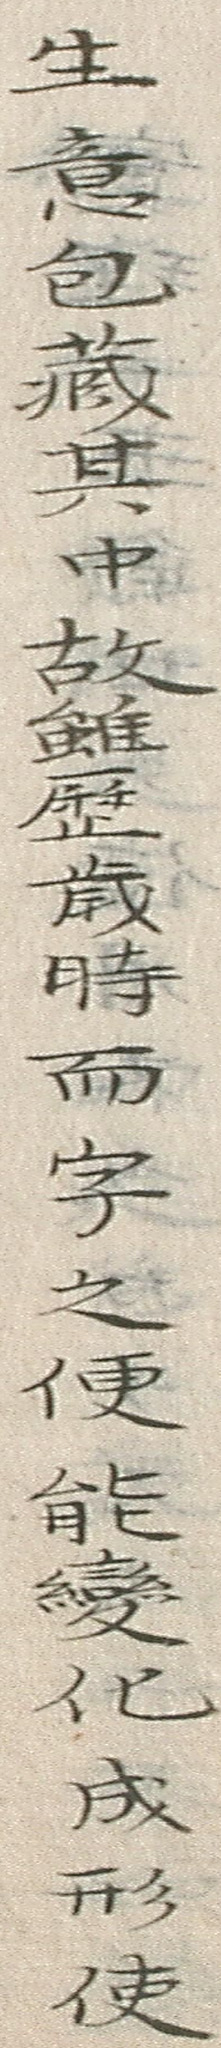生意包蔵其中故雖歴歳時而字之便能変化成形使
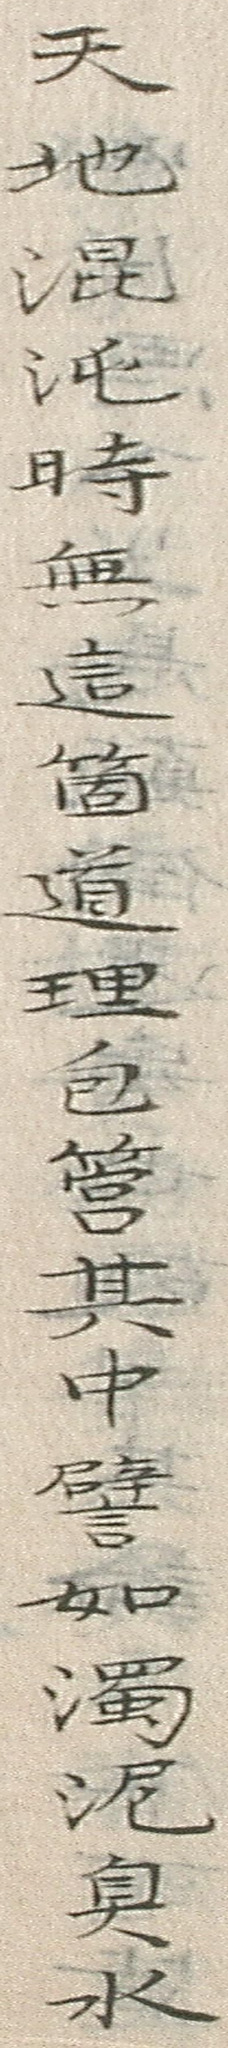天地混沌時無這箇道理包管其中譬如濁泥臭水
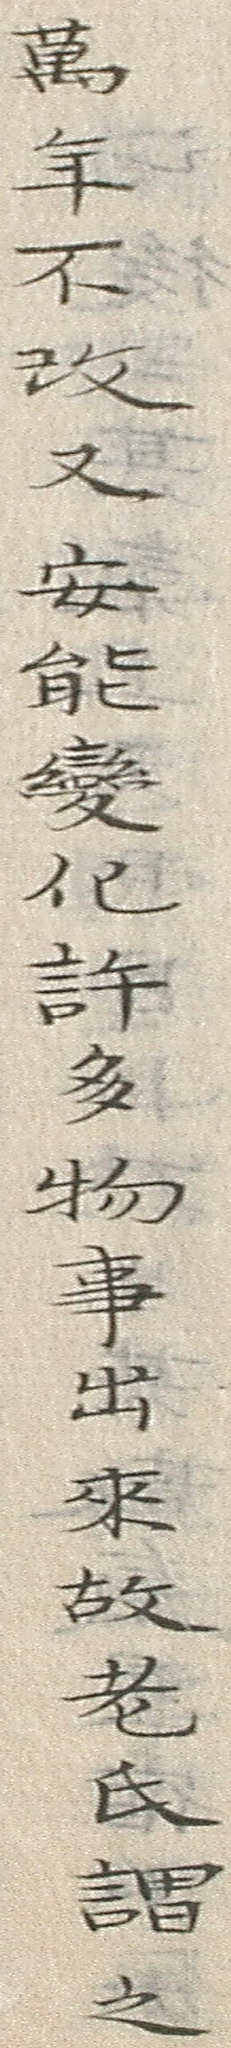万年不改又安能変化許多物事出来故老子謂之
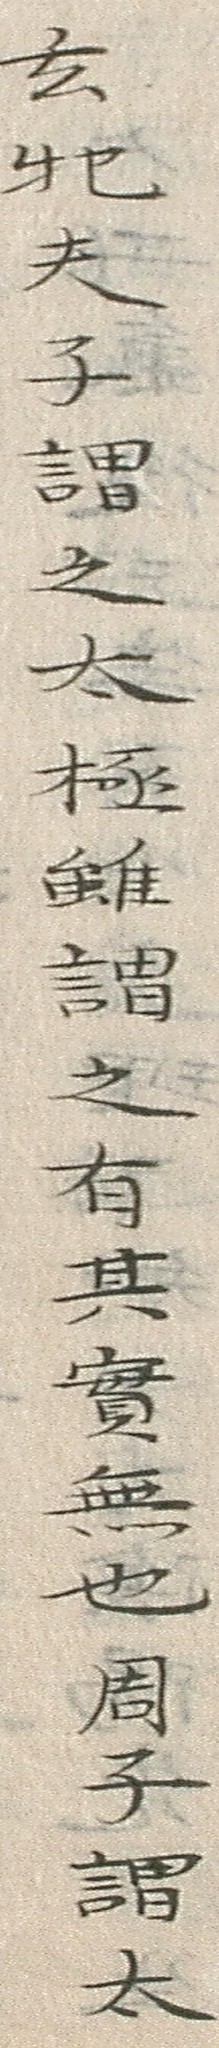玄牝夫子謂之太極雖謂之有其実無也周子謂太
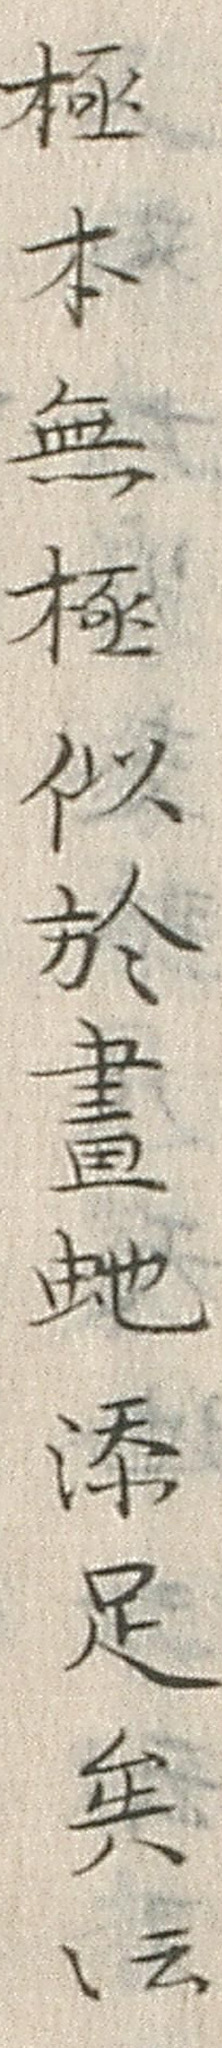極本無極似於画虵添足矣云〻
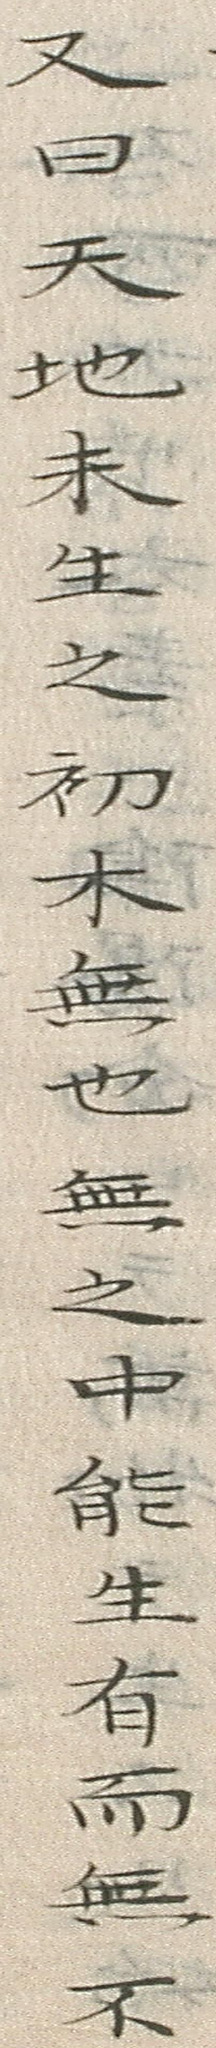又曰天地未生之初木無也無之中能生有而無不
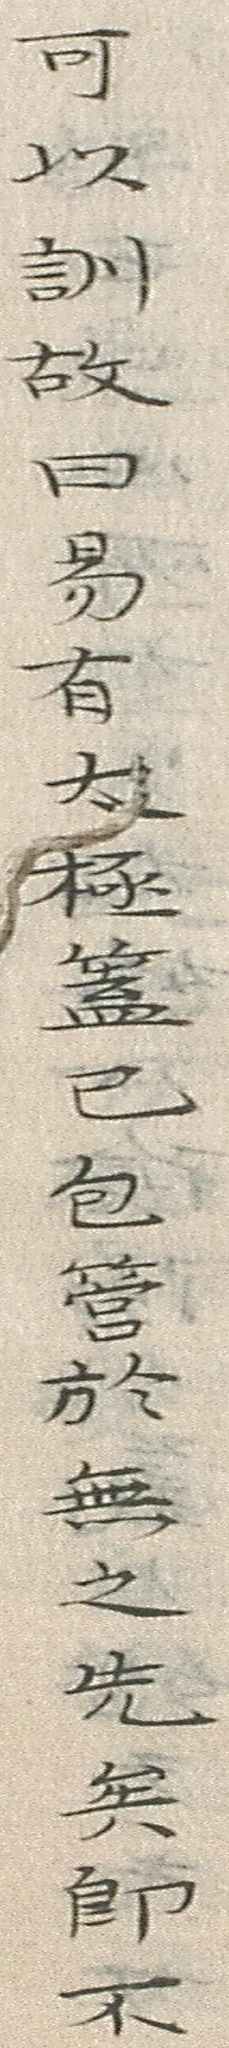可以訓故曰易有太極蓋已包管於無之先矣即不
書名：天學略名目羽翼　全
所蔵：東京大学地震研究所図書室 Earthquake Research Institute Library, The University of Tokyo, JAPAN
